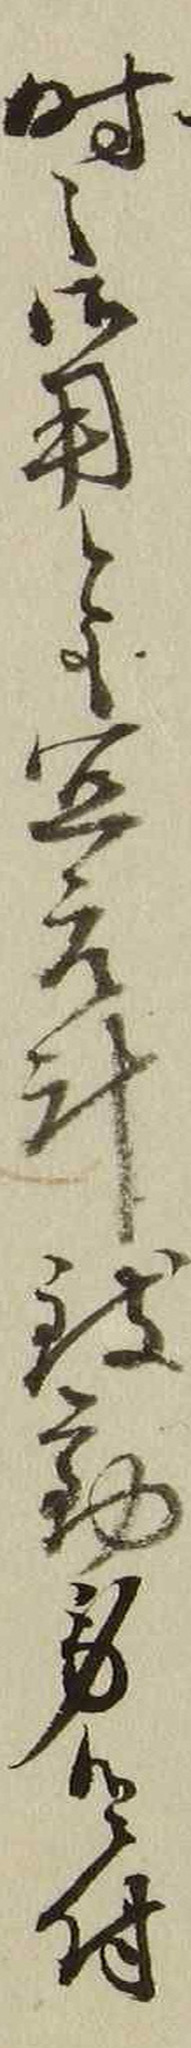時之御用とも宜取計致勤身候ニ付
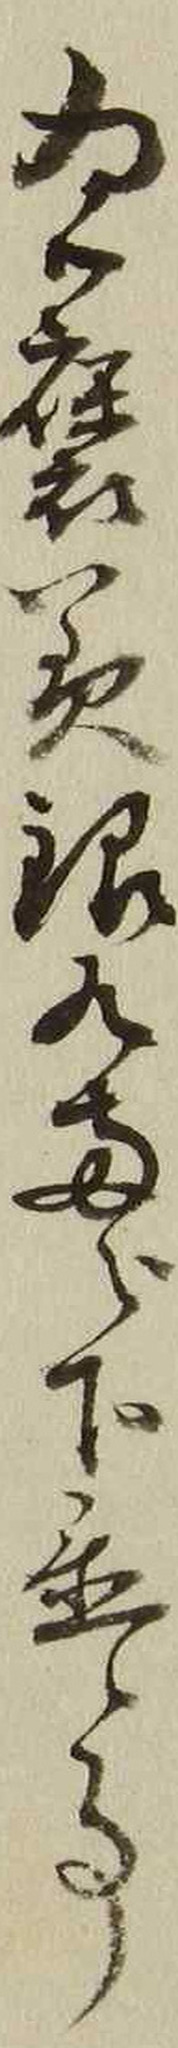為御褒美銀九両被下置候事
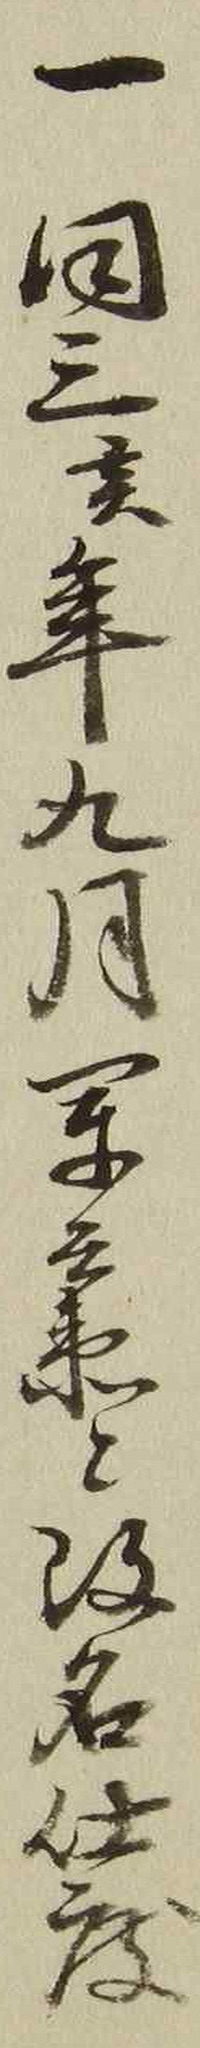一同三亥年九月軍兵衛と改名仕度
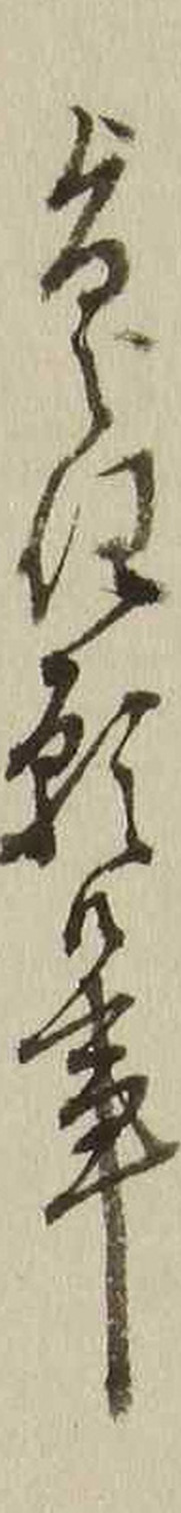旨被任願候事
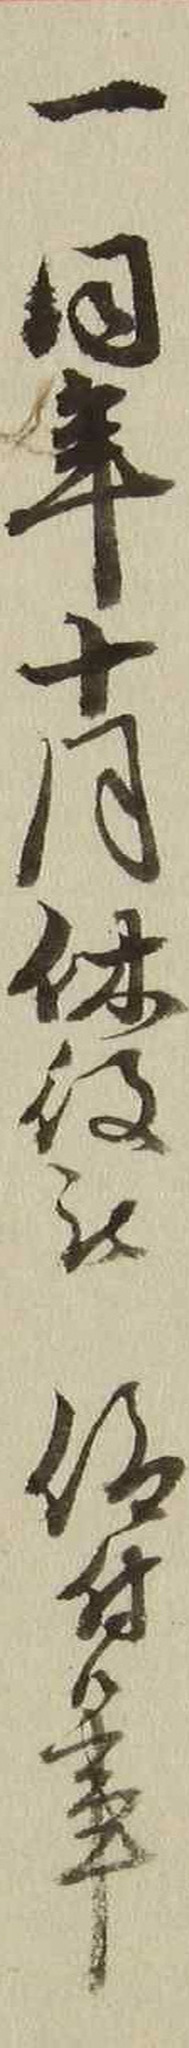一同年十月休役被仰付候事
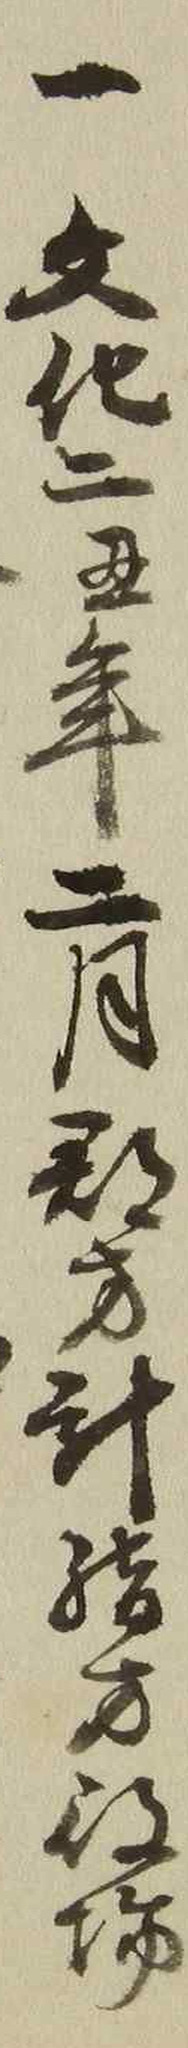一文化二丑年二月郡方計絹方役場
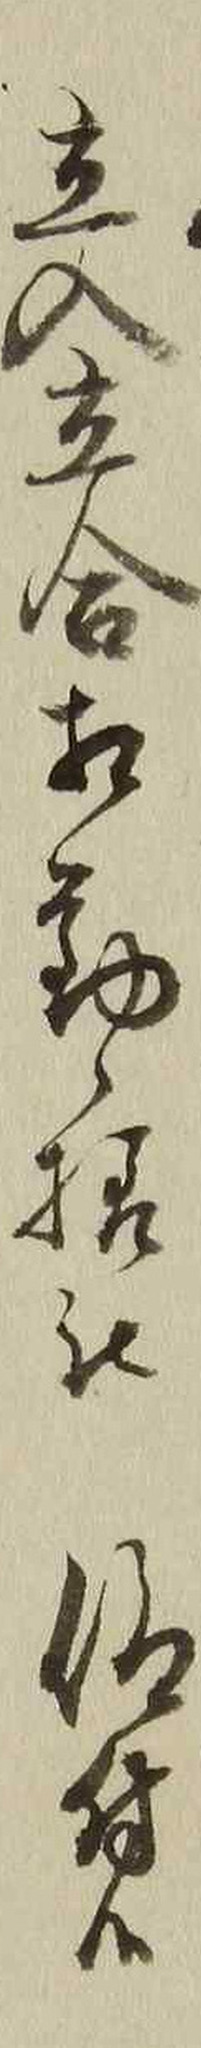立入立合相勤候様被仰付候
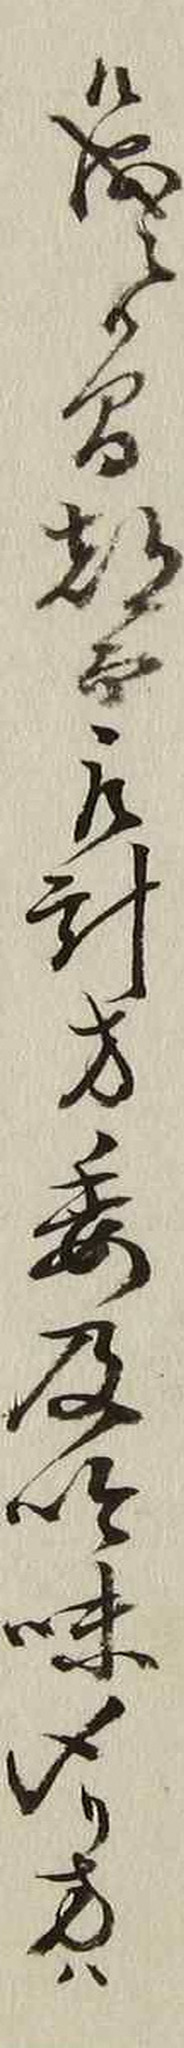候儀ニ候間都而取計方委及吟味〆り方ハ
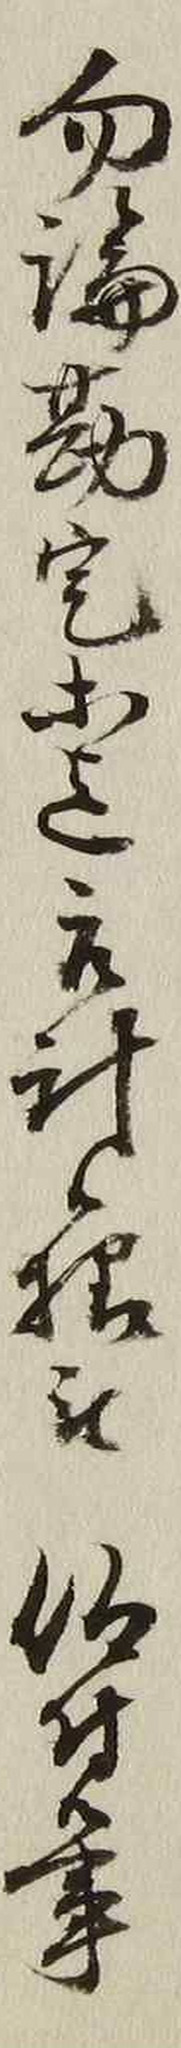勿論勘定等迄取計候様被仰付候筆
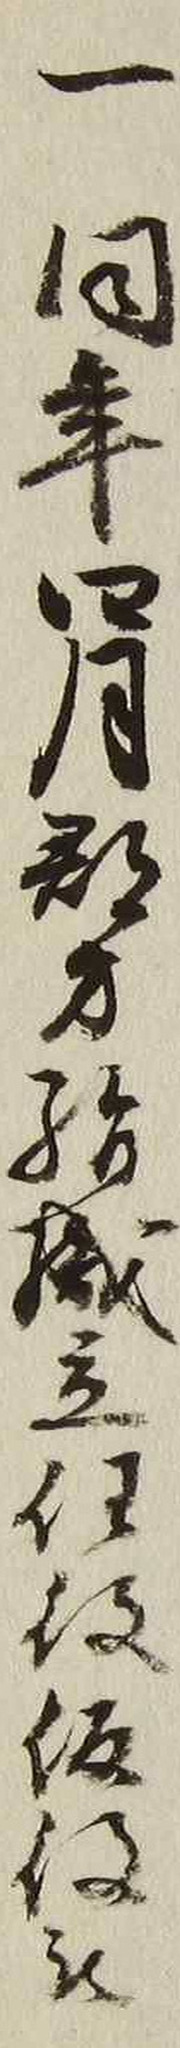一同年四月郡方絹織立任役仮役被
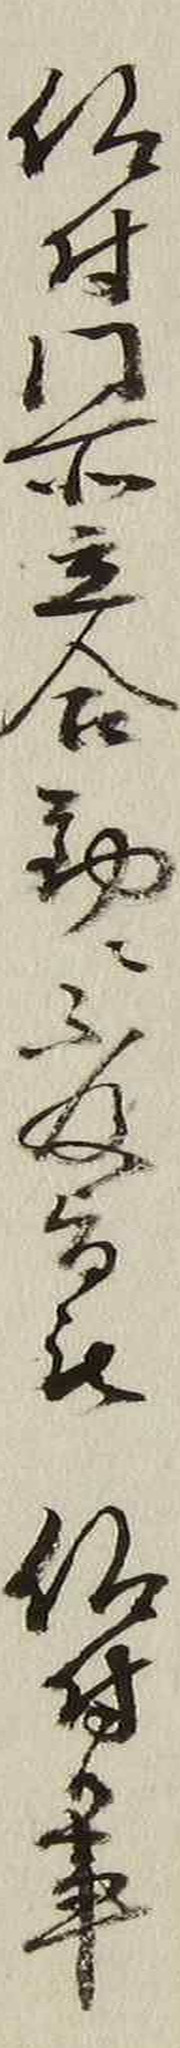仰付同所立合勤ニ不及旨被仰付候事
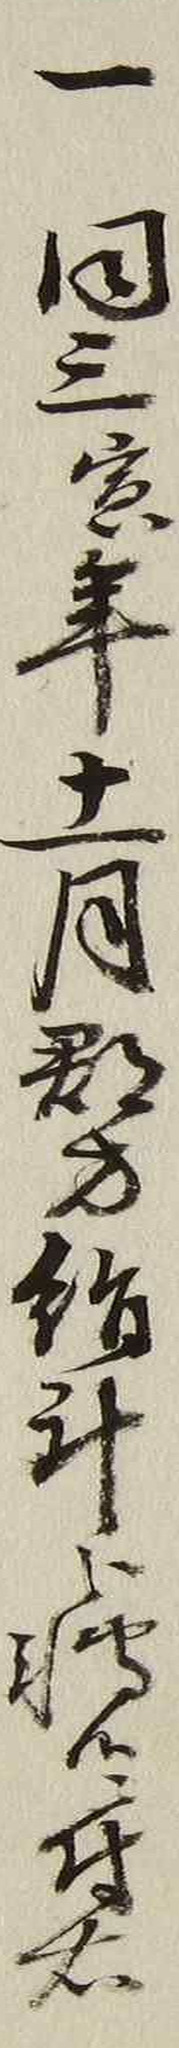一同三寅年十一月郡方絹計被転候ニ付右
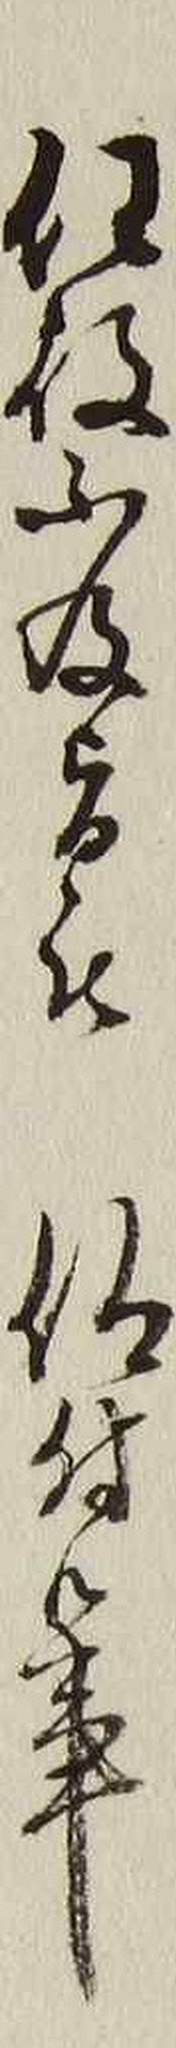任役不及旨被仰付候事
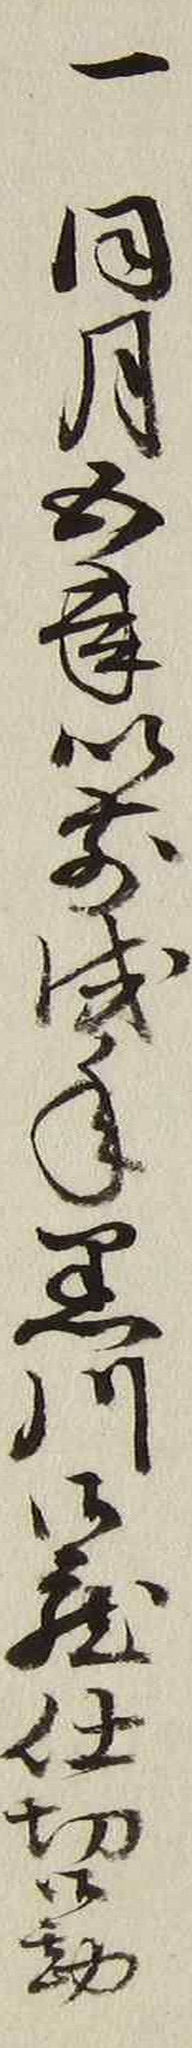一同月五年以前戌年黒川御蔵仕切御勘
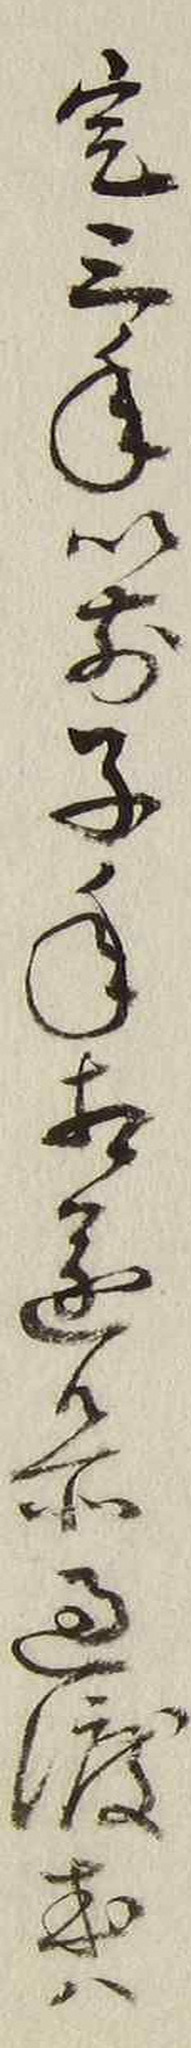定三年以前子年相遂候所過渡成ハ
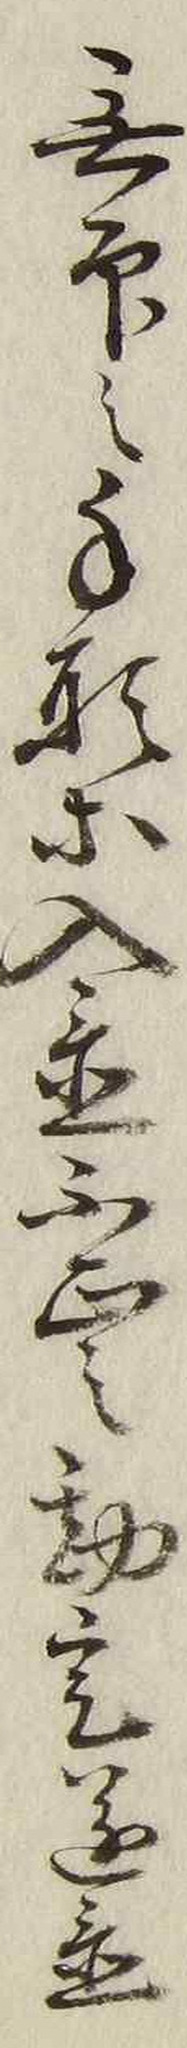無印之手形等入置不正之勘定遂置,
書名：諸士系譜　巻之39　は之部7
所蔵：会津若松市立会津図書館
